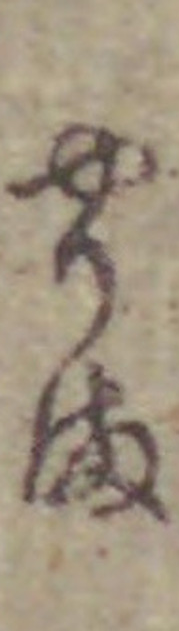やりま
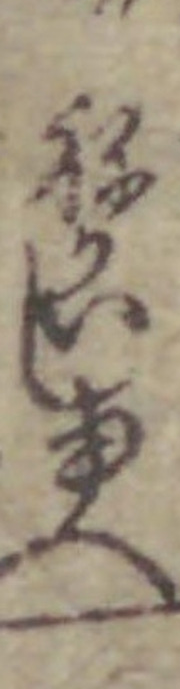ねかいしゆへ
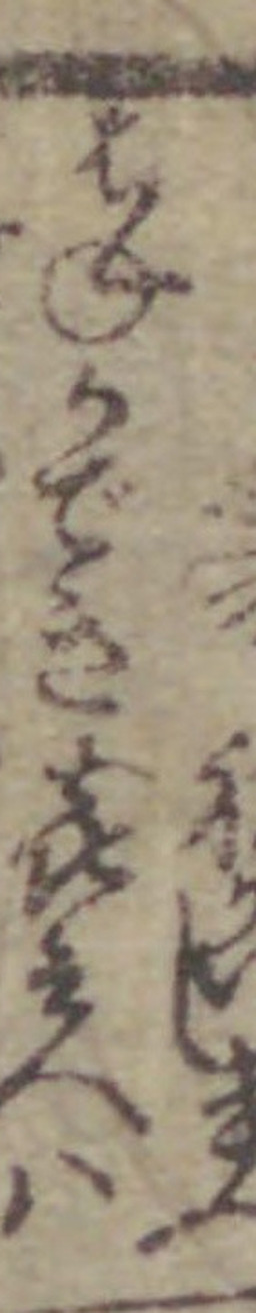はねかでき喜兵へは
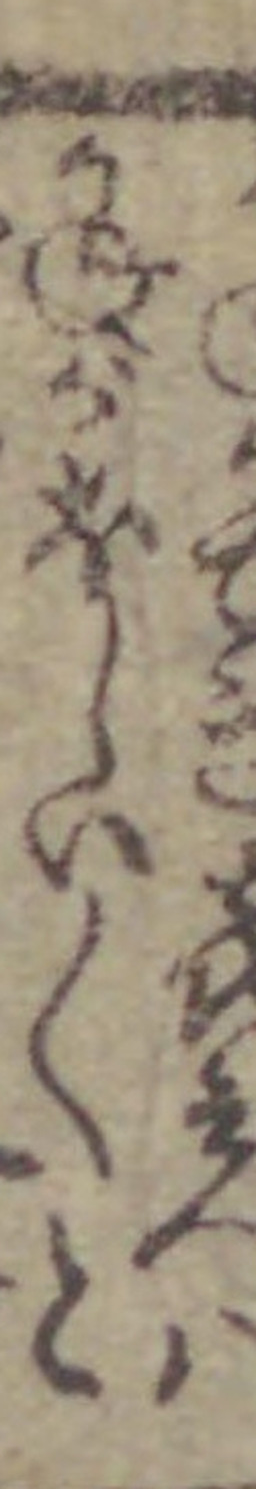かねがほしい〳〵と
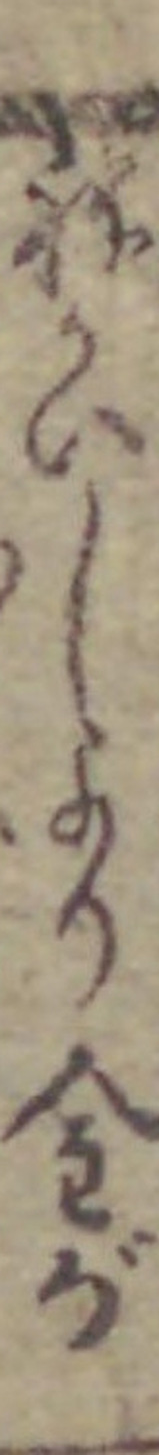ねかいしより金が
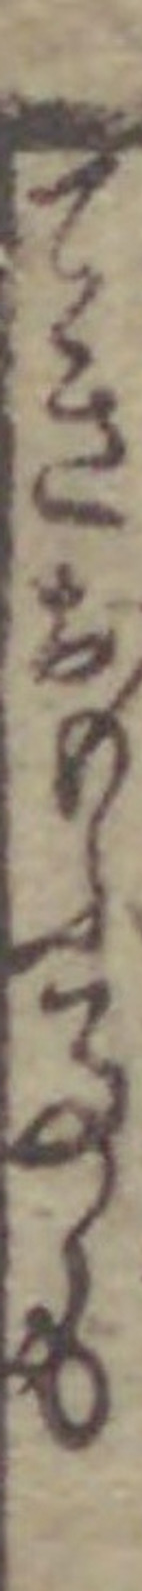てきおもふ事も
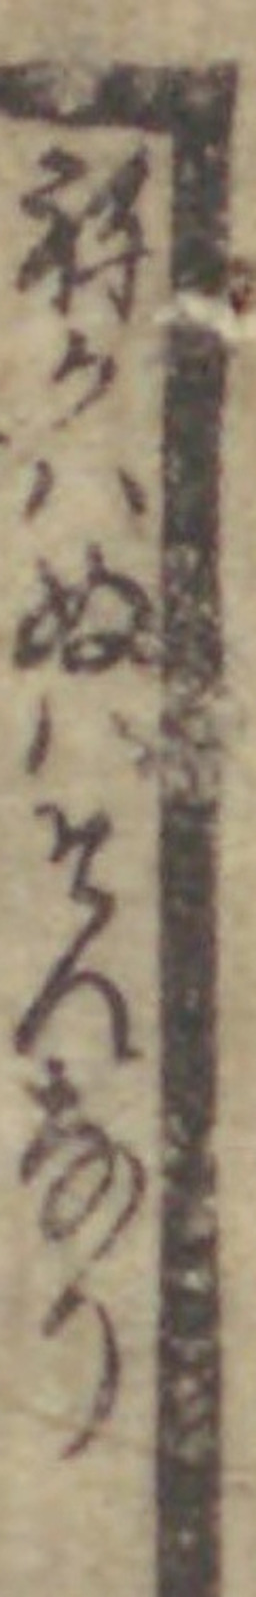ねかはぬはそんなり
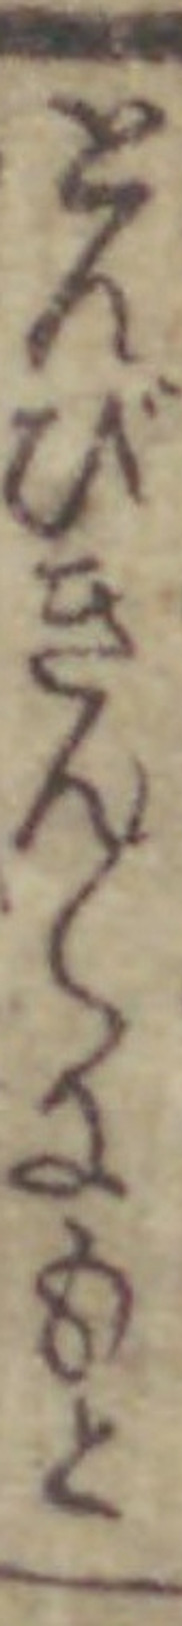とんびきん〳〵にもと
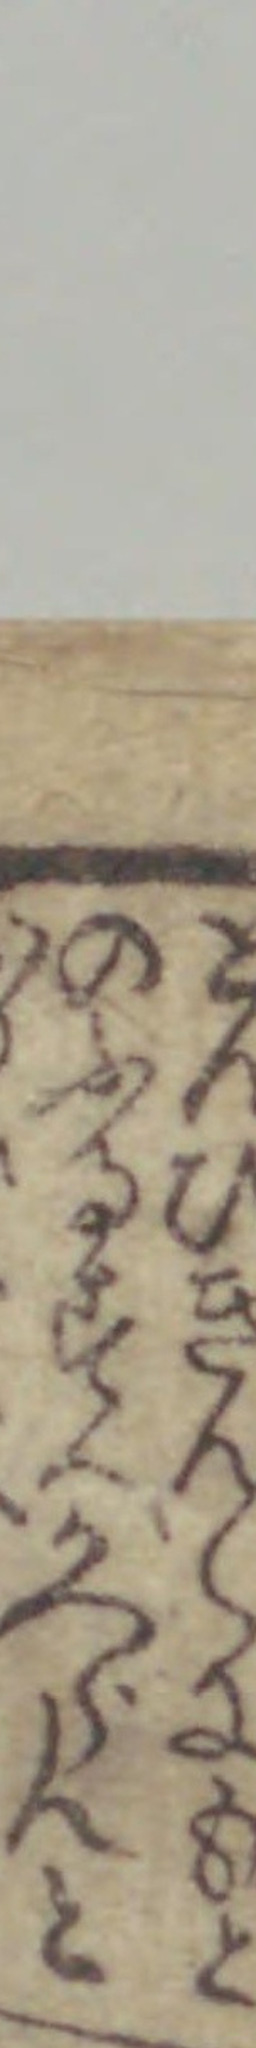のふるすへかへらんと
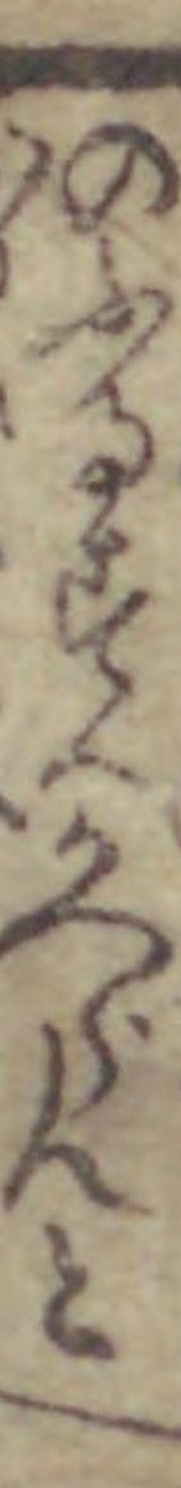のふるすへかへらんと
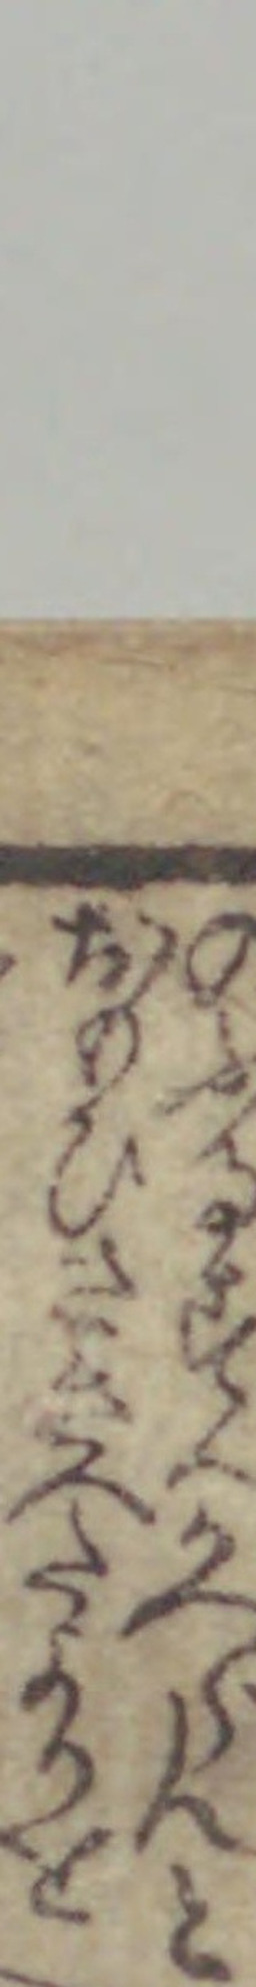おもひさきへたよりを
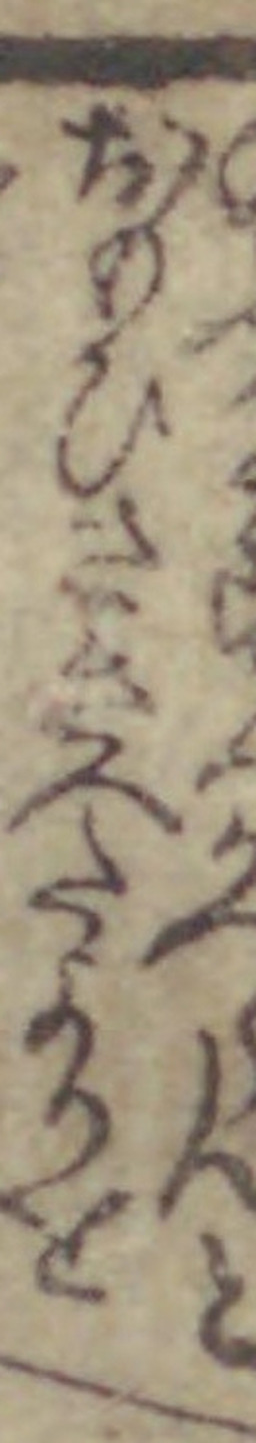おもひさきへたよりを
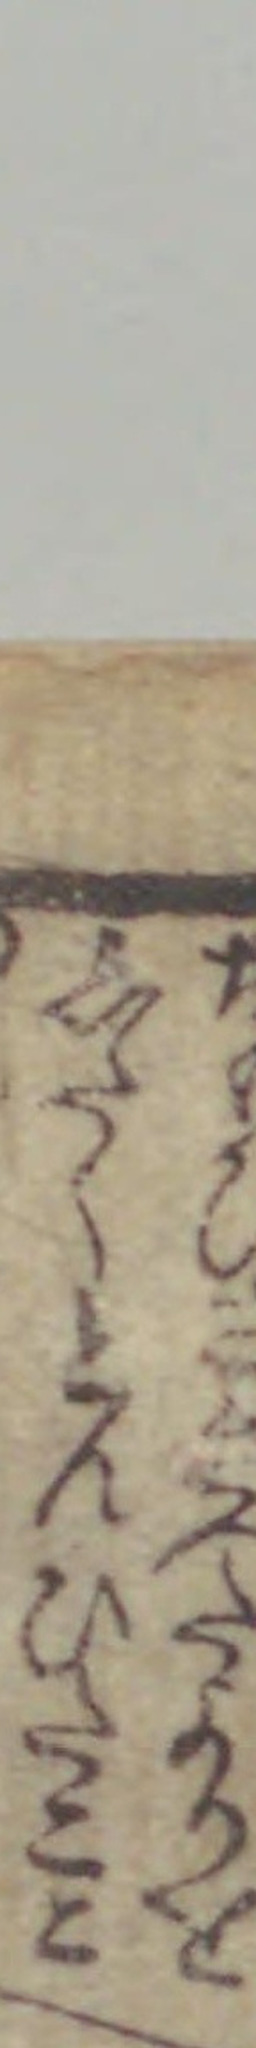したくとんひたこと
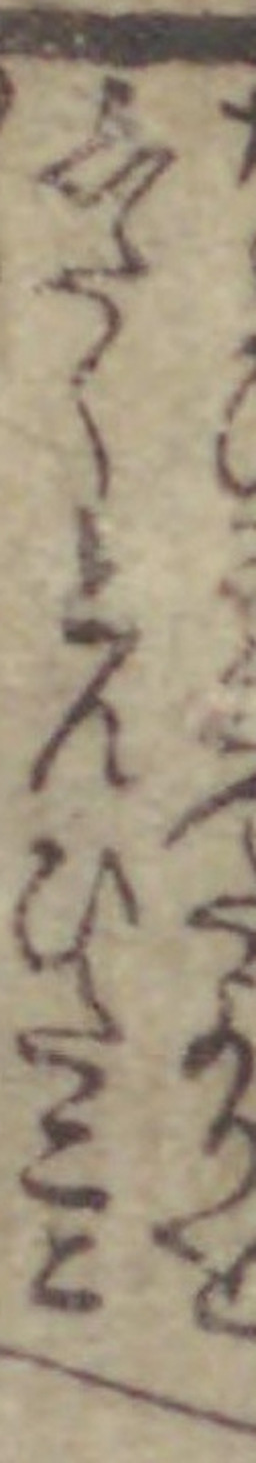したくとんひたこと
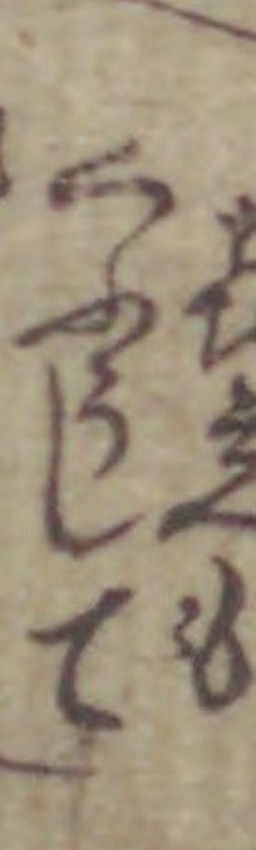くふうして
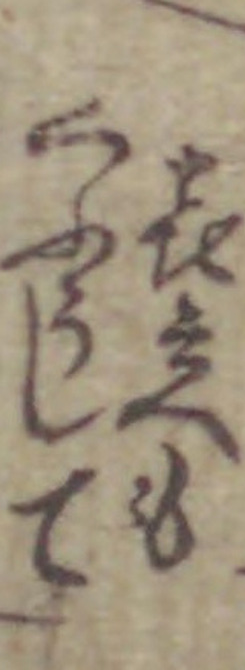くふうして
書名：親父布子鳶握 3巻
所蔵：国立国会図書館 National Diet Library, JAPAN
